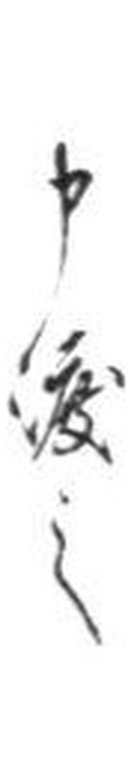申渡之
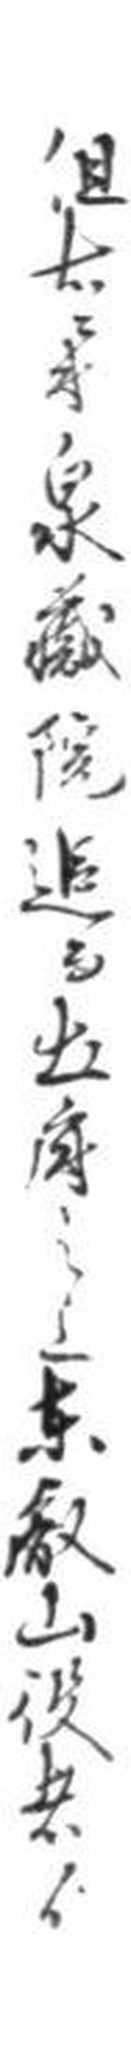但右ニ付泉蔵院追而出府之上東叡山役者ゟ
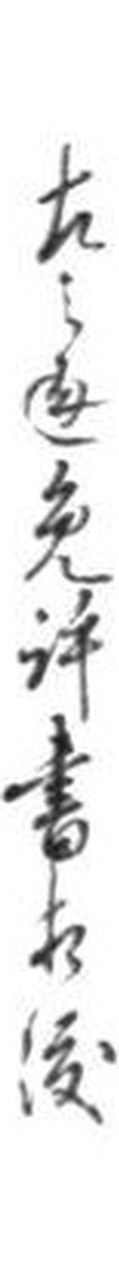左之通免許書相渡
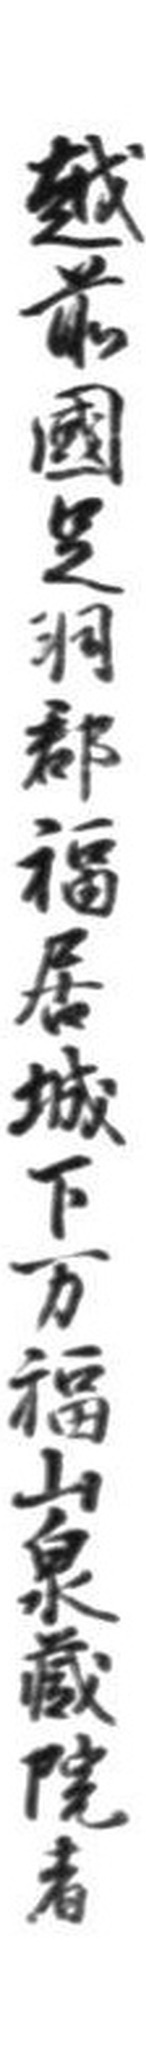越前国足羽郡福居城下万福山泉蔵院者
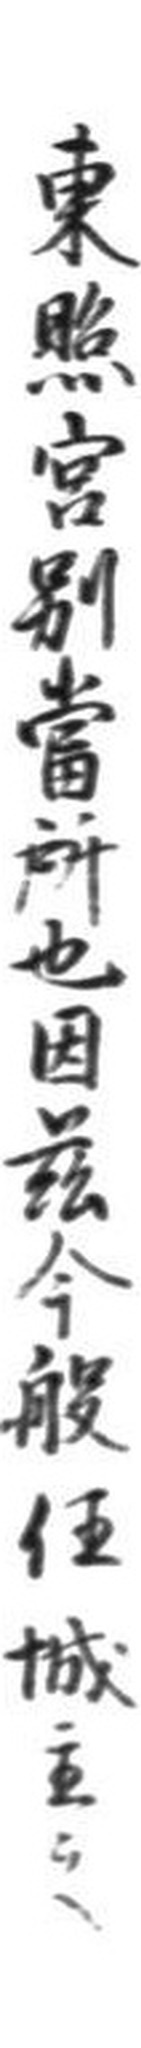東照宮別当所也因茲今般任城主之
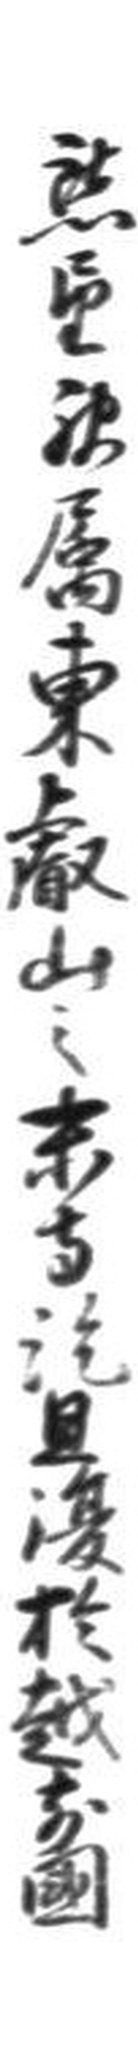懇望被属東叡山之末寺訖且復於越前国
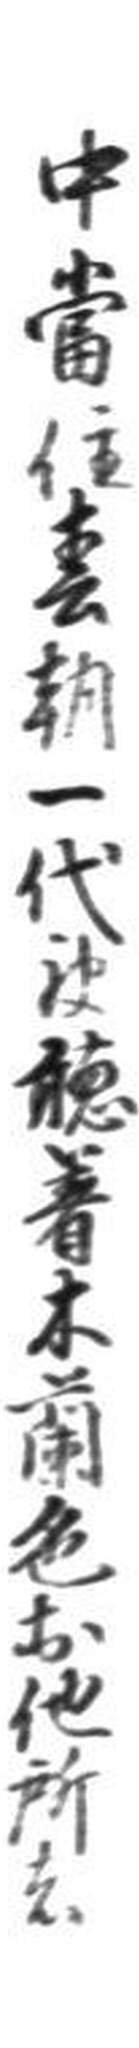中当住春朝一代被聴着木蘭色於他所者
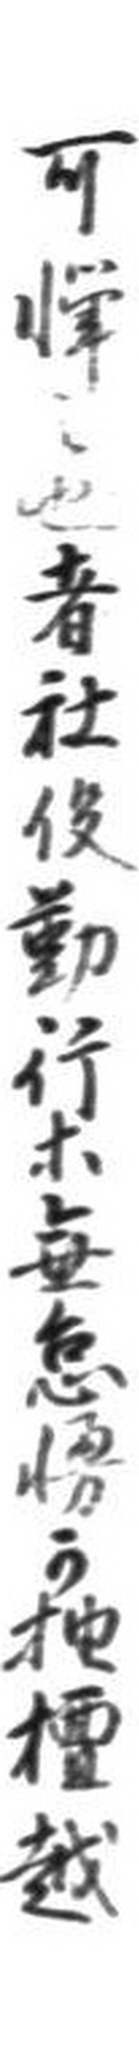可憚之也者社役勤行等無怠慢可抽檀越
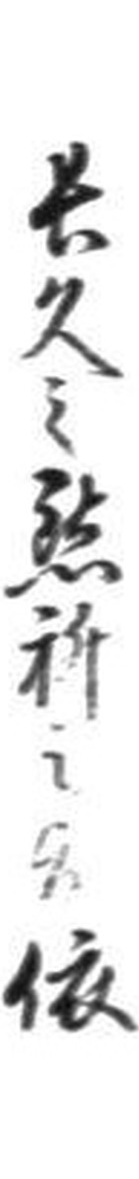長久之懇祈之旨依
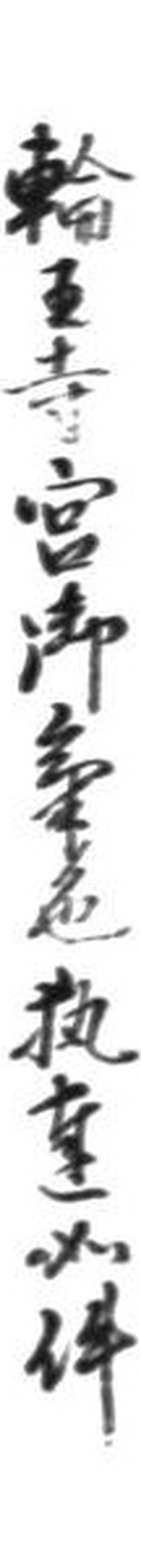輪王寺宮御気色執達如件

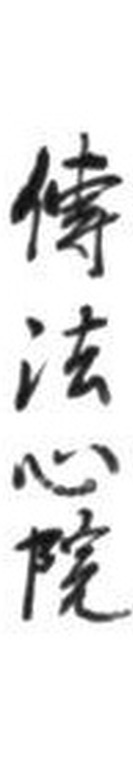伝法心院
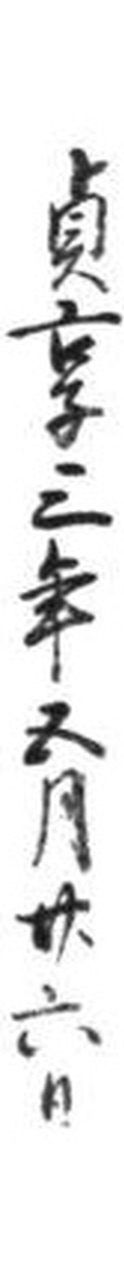貞享三年五月廿六日判
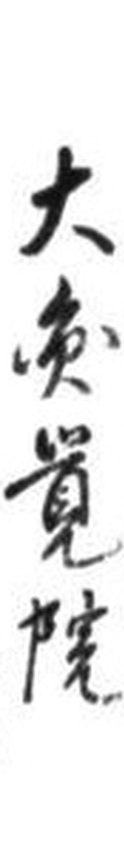大円覚院
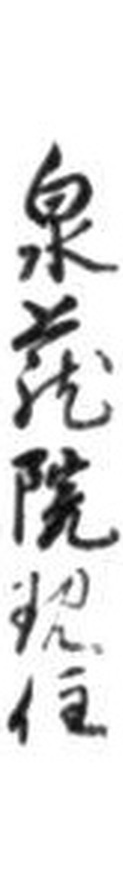泉蔵院現住
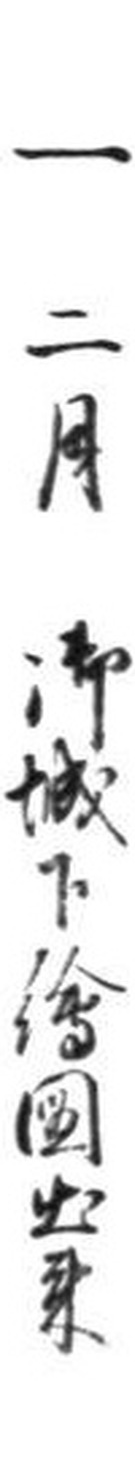一二月御城下絵図出来
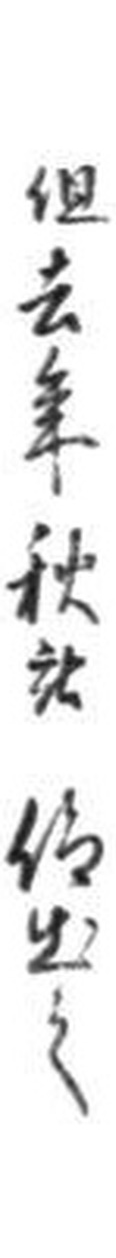但去年秋被仰出之
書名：家譜 十五 綱昌公 従天和元年到元禄十二年
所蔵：福井県文書館 Fukui Prefectural Archives
